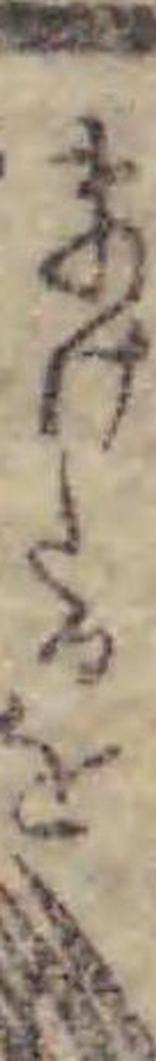まけたるを
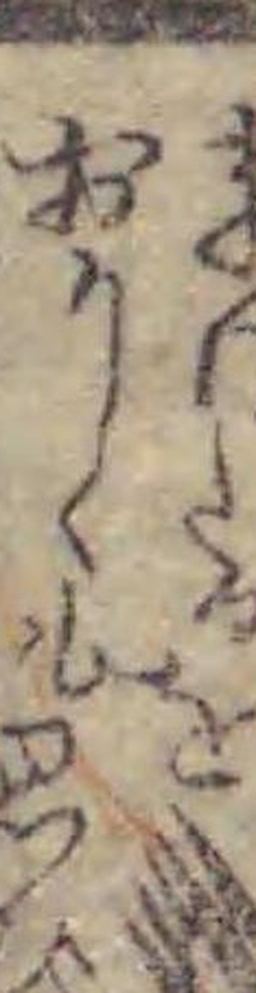おかしくも思ひ
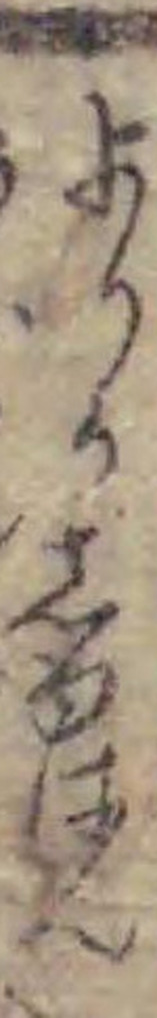よりかしゆはん
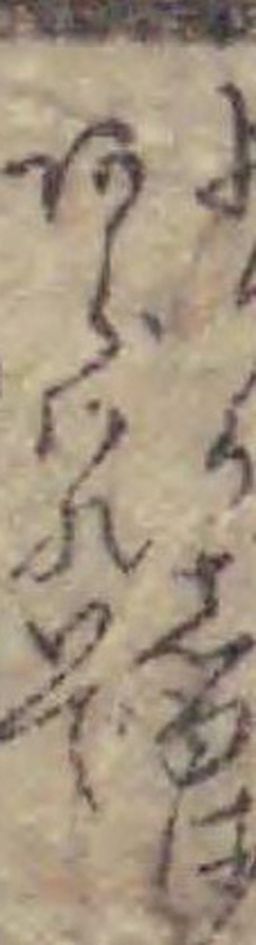あらはれいで
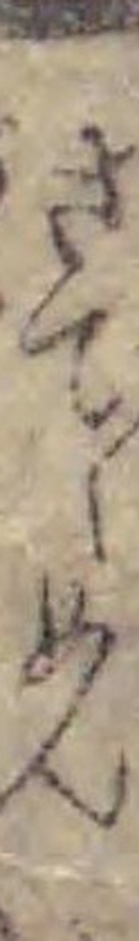さて〳〵めん
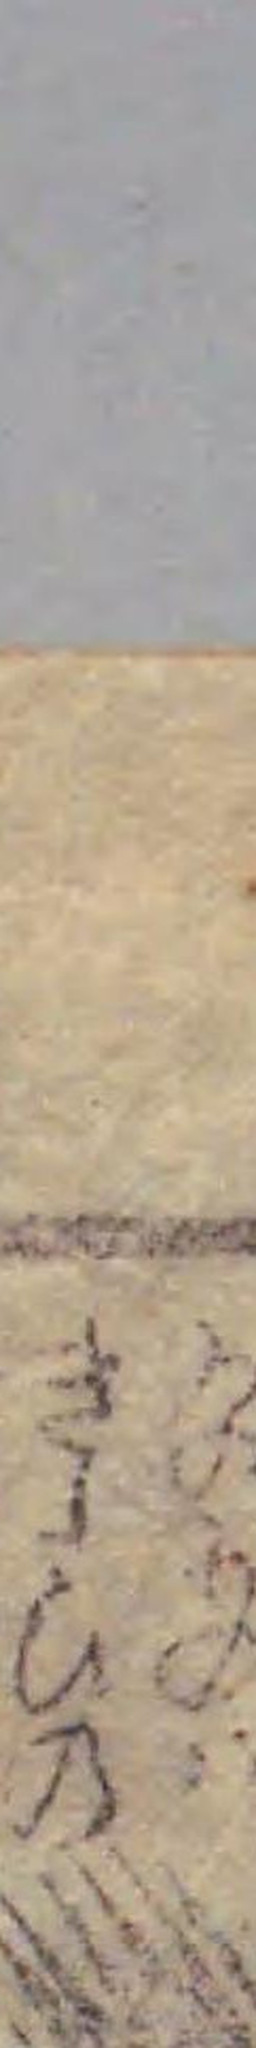きたひの
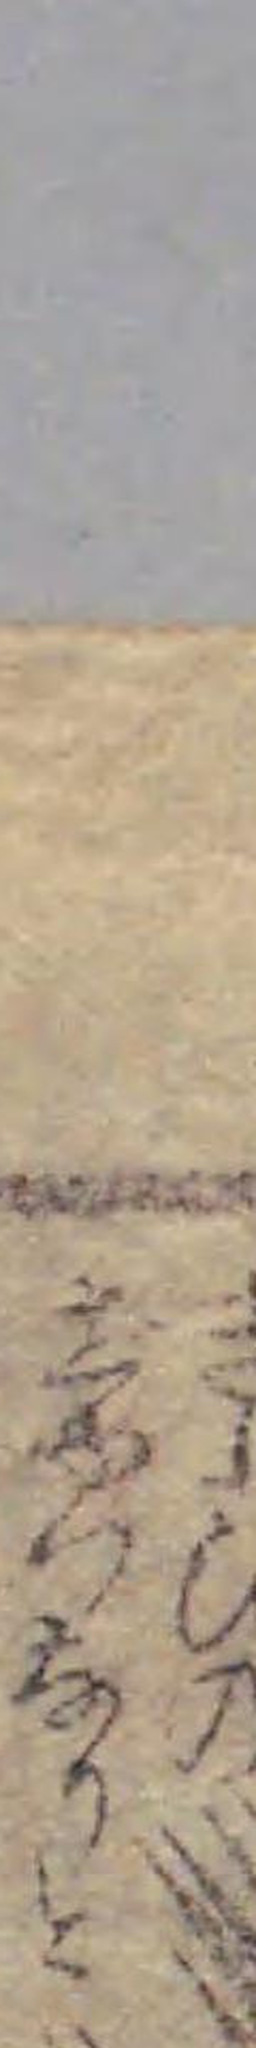じゆつなりと
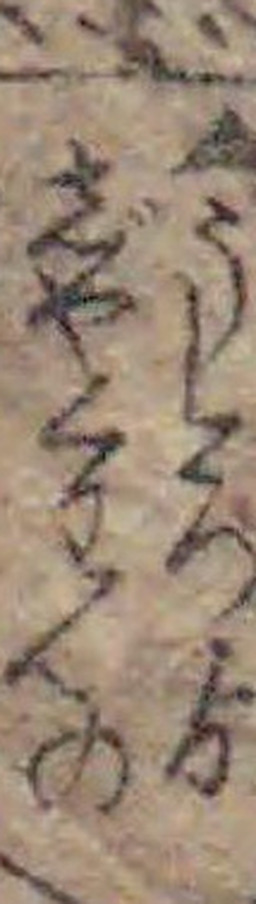じやくわんの
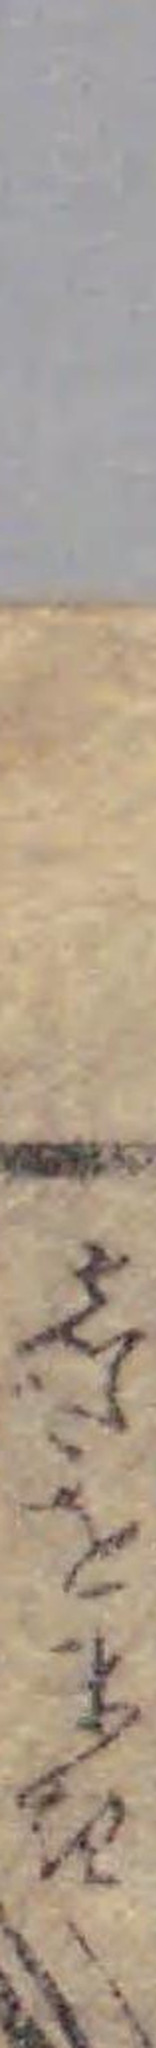したをまき
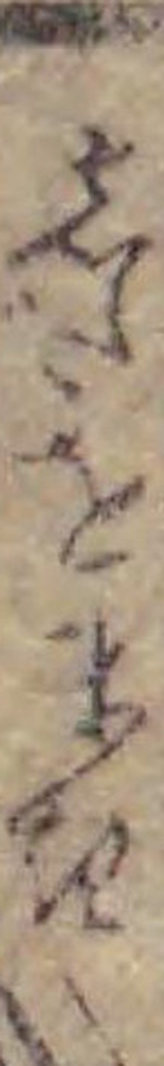したをまき
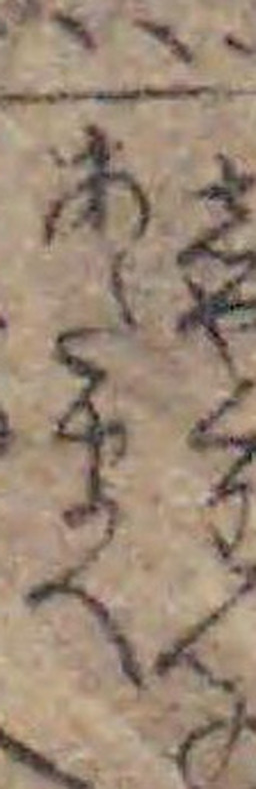あたまへ
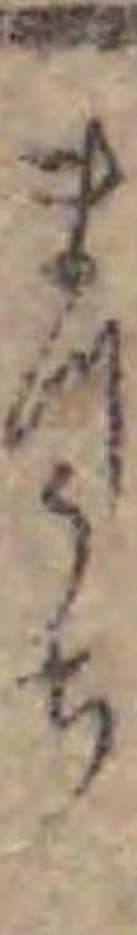まづうち
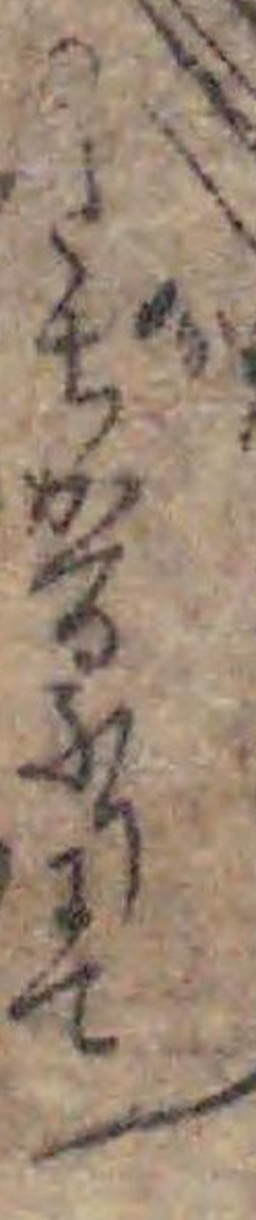○たちかへるふりにて
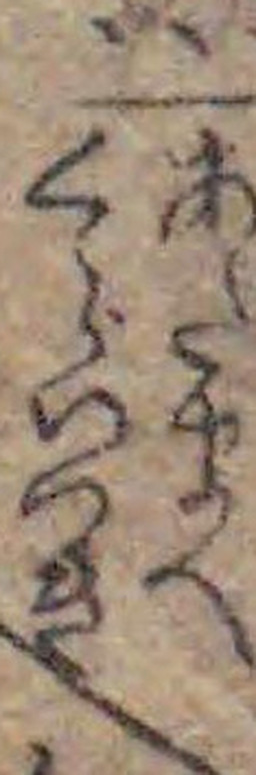くらいつき
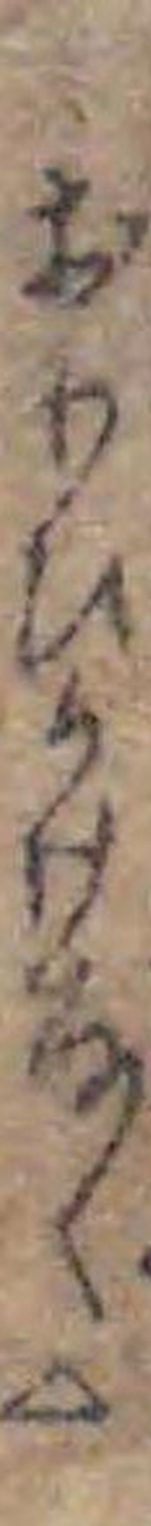おもひかけなく▲
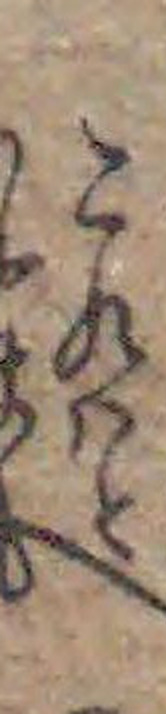これはと
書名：化物世界夜半嵐 : 3巻
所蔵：国立国会図書館 National Diet Library, JAPAN
